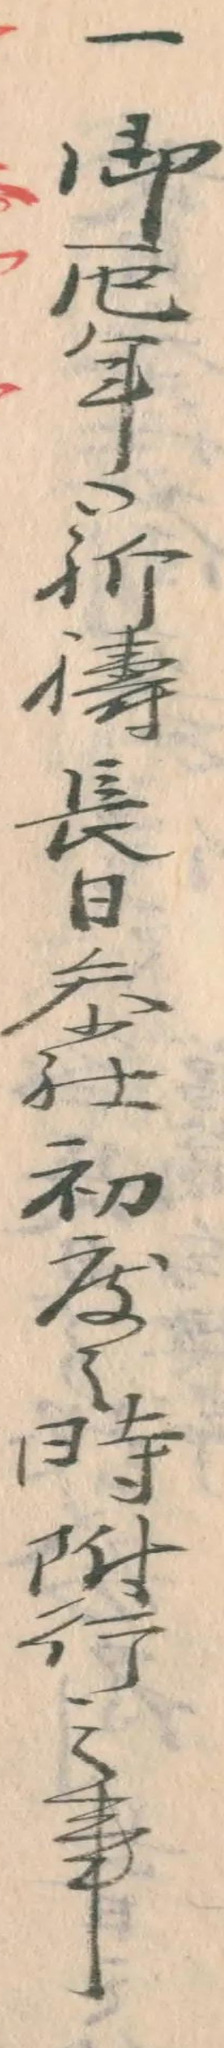一御厄年御祈祷長日参社初度之時附行之事
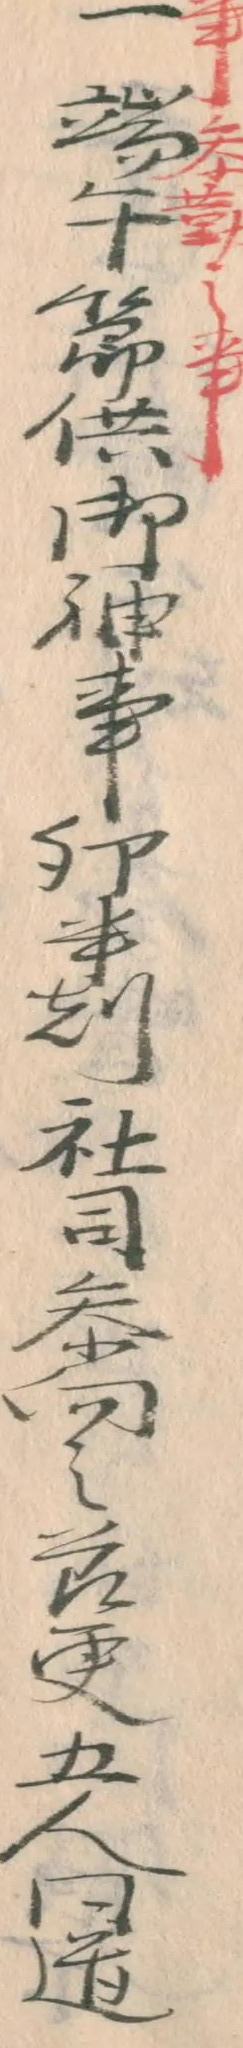一端午節供御神事卯半刻社司参向之節更五人同道
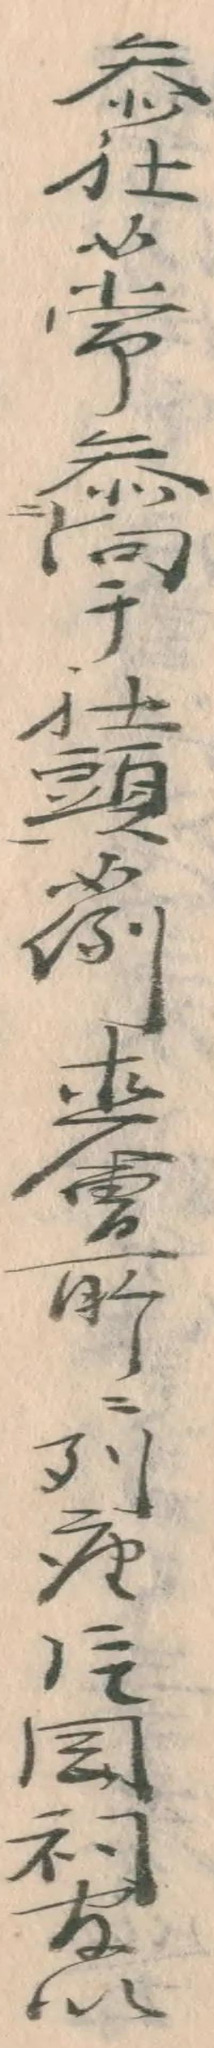参社如常参向于社頭如例直會所ニ列座片岡祠官以
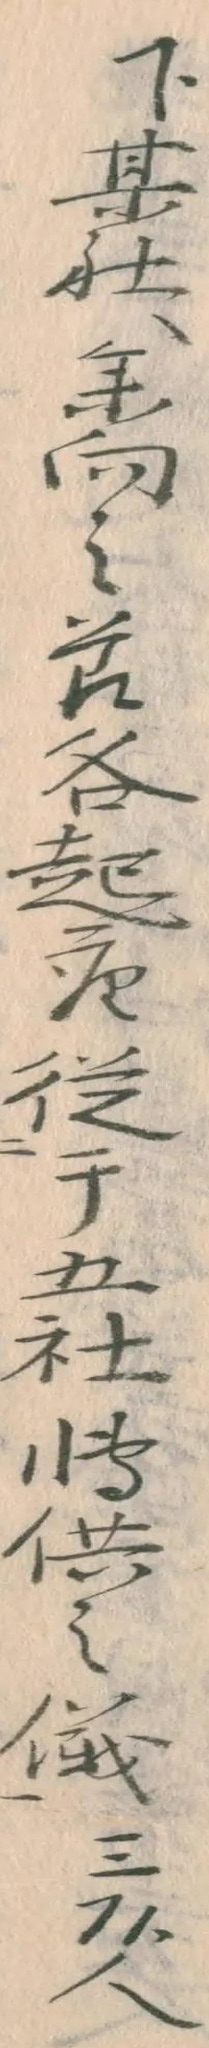下其社へ参向之節各起座従于五社轉供之儀三万人
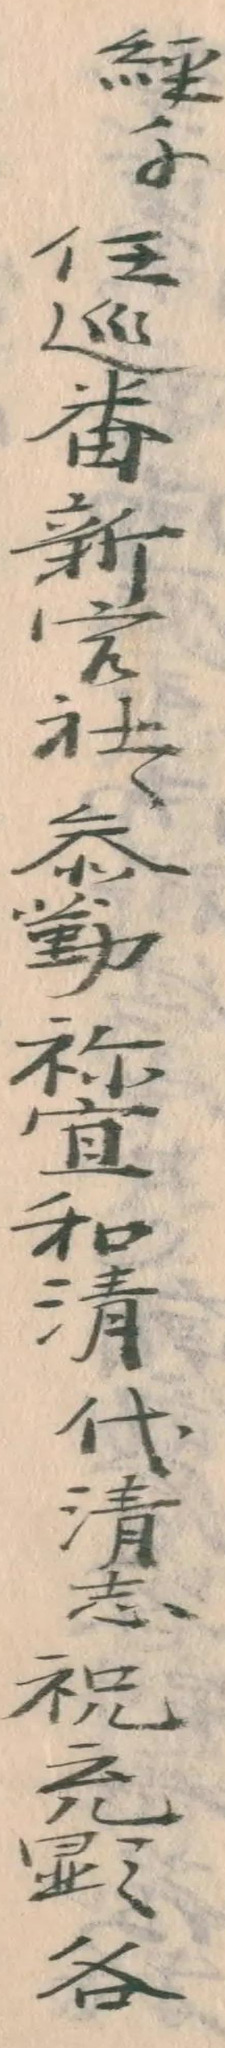経千任巡番新宮社へ参勤祢宜和清代清志祝充顕各
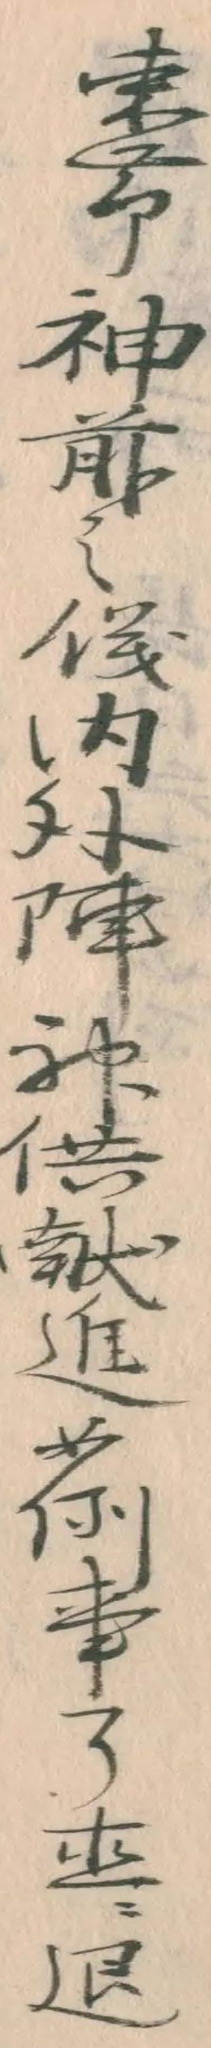束帯神前之儀内外陣神供献進如例事了直ニ退
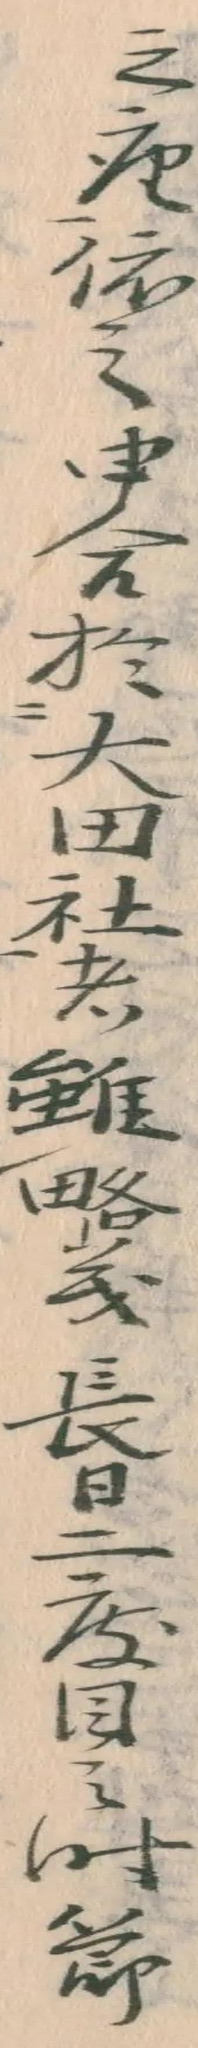之座依之申合於大田社は雖略義長日二度目之時節
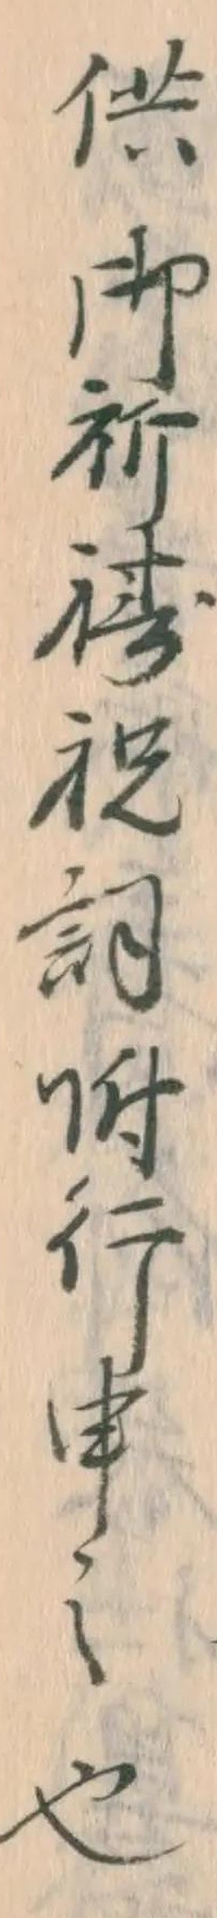供御祈祷祝詞附行申之也
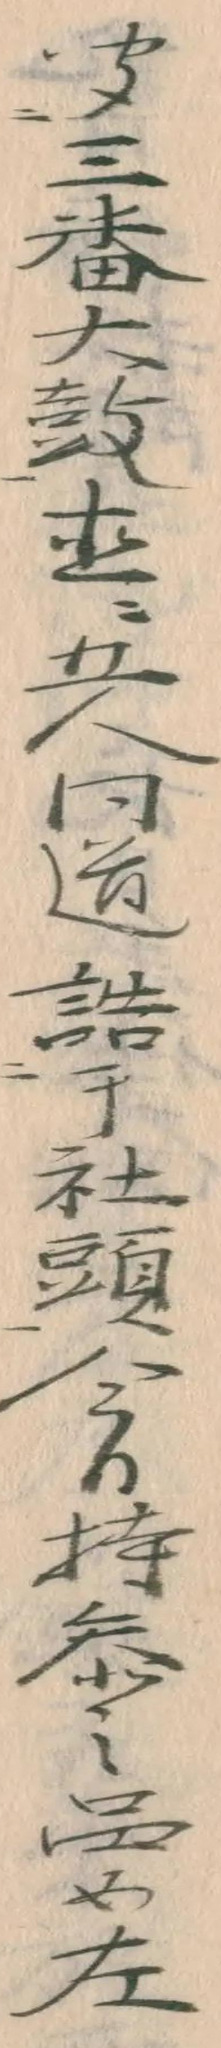聞三番大皷直ニ五人同道詰于社頭今日持参之品如左
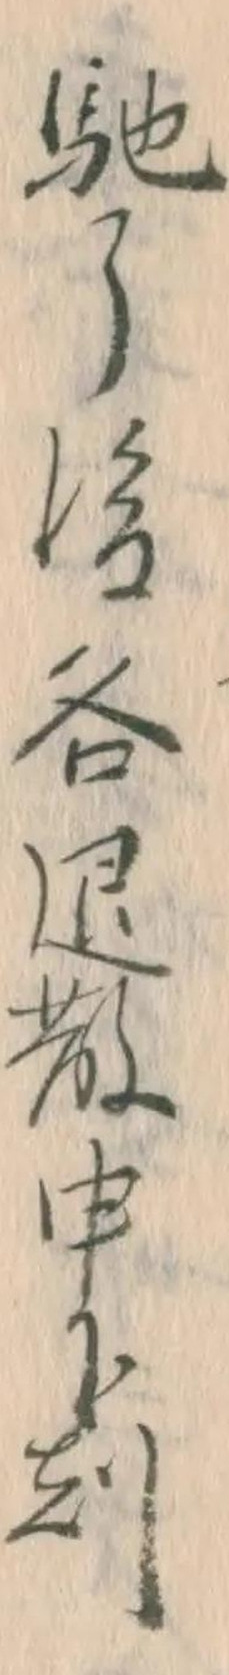馳了後各退散申下刻
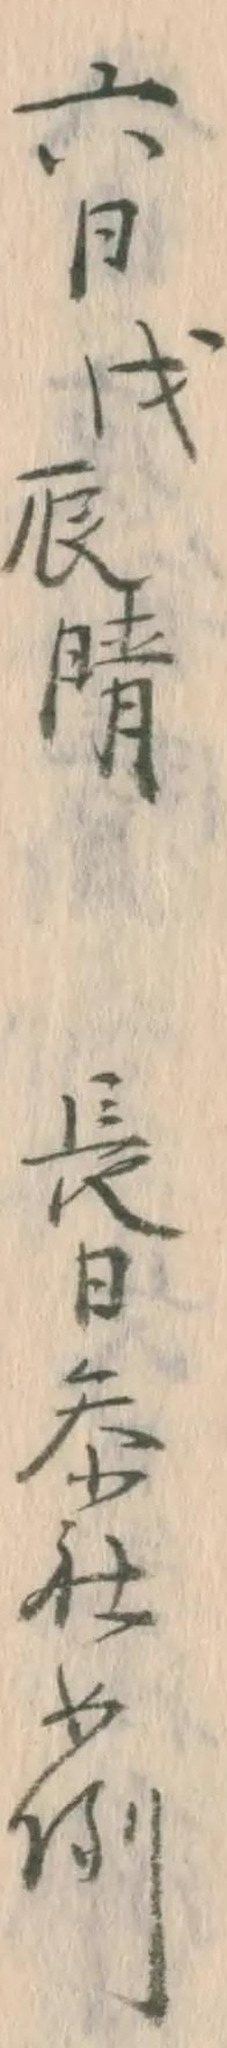六日戊辰晴長日参社如例
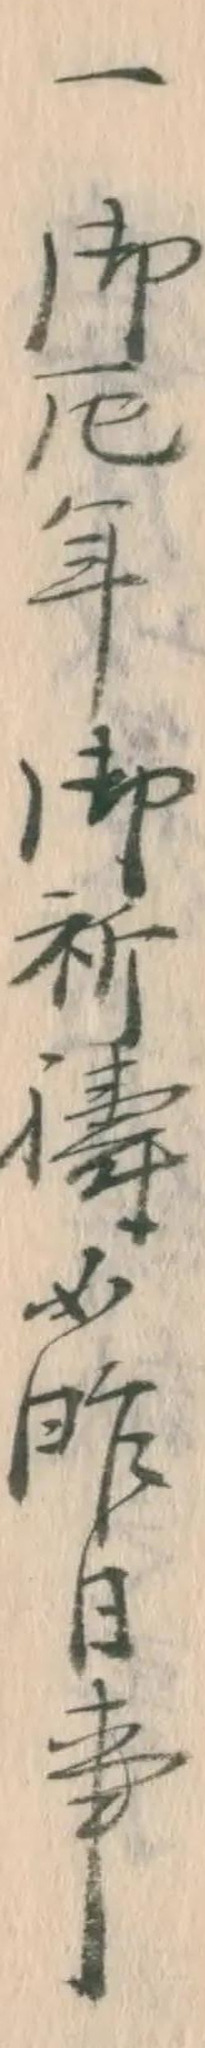一御厄年御祈祷如昨日事
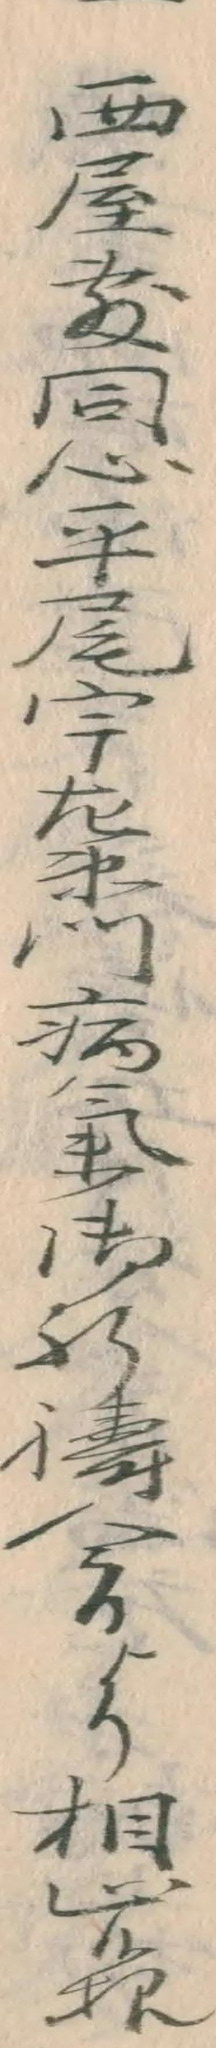一西屋敷同心平尾宇左衛門病氣御祈祷今日より相止候様
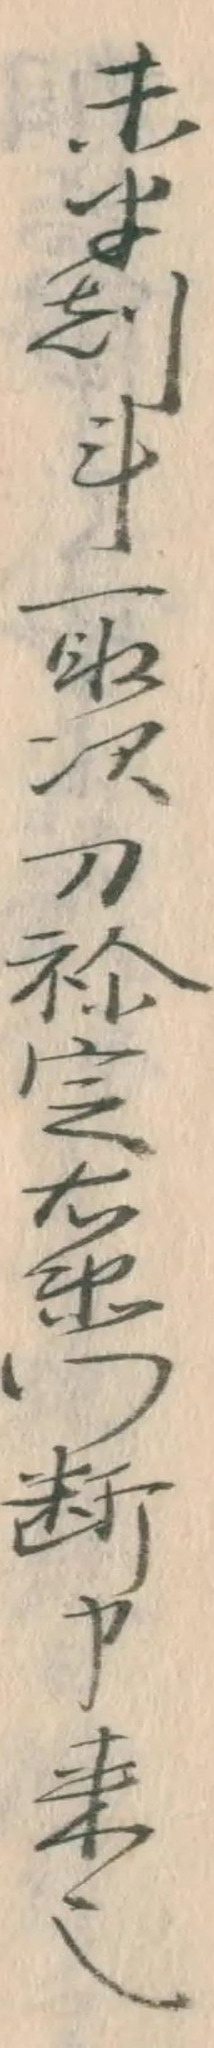未半刻斗取次刀祢定右衛門断申来也
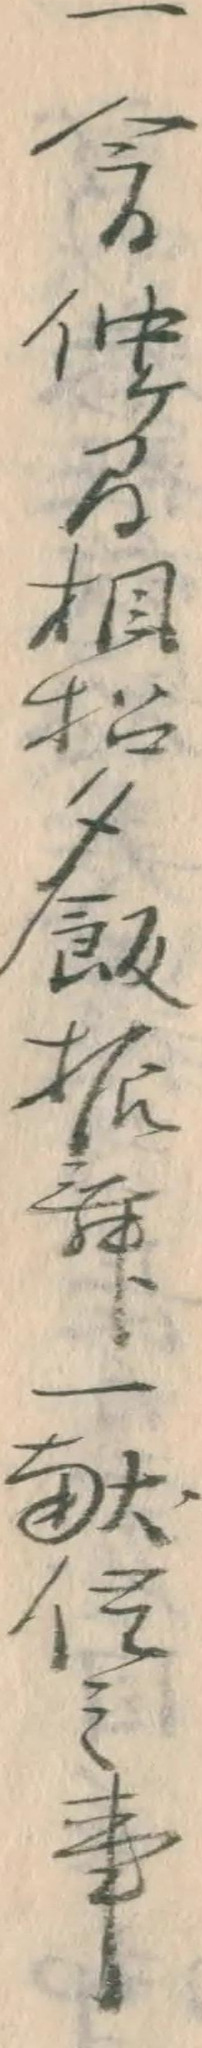一今日仲ヶ間相招夕飯振舞一献位之事
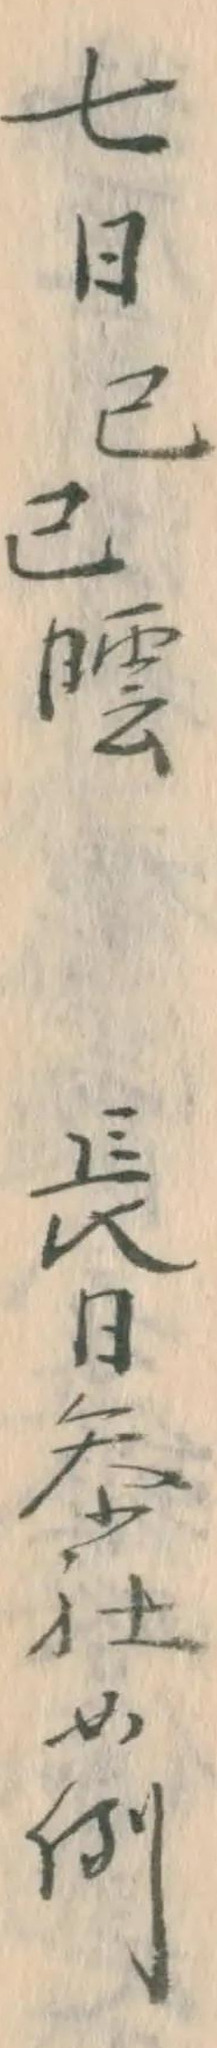七日己巳雲長日参社如例
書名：賀茂社記録. 第73冊
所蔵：国立国会図書館 National Diet Library, JAPAN
